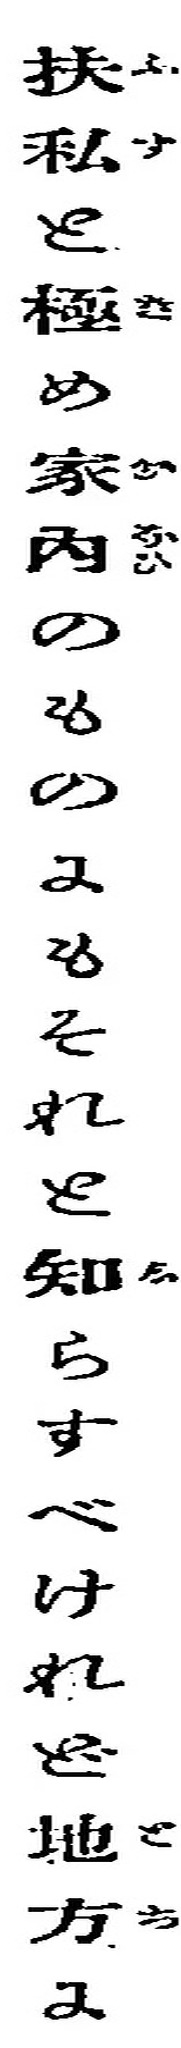扶私と極め家内のものにもそれと知らすべけれど地方に
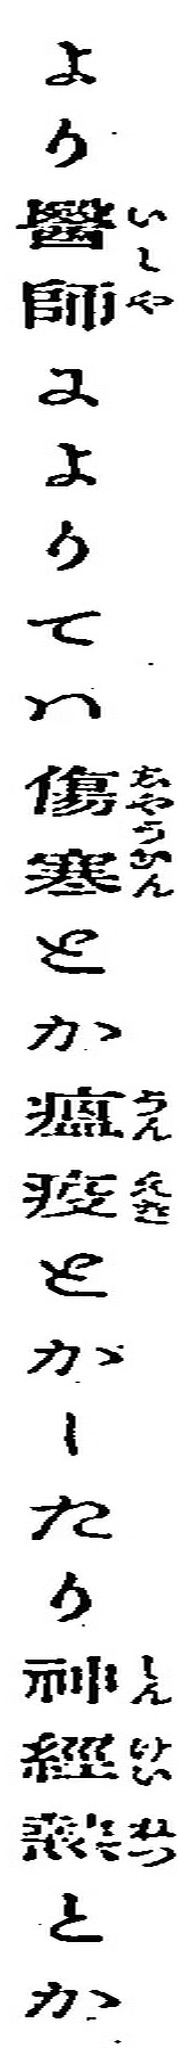より醫師によりては傷寒とか瘟疫とかしたり神經熱とか
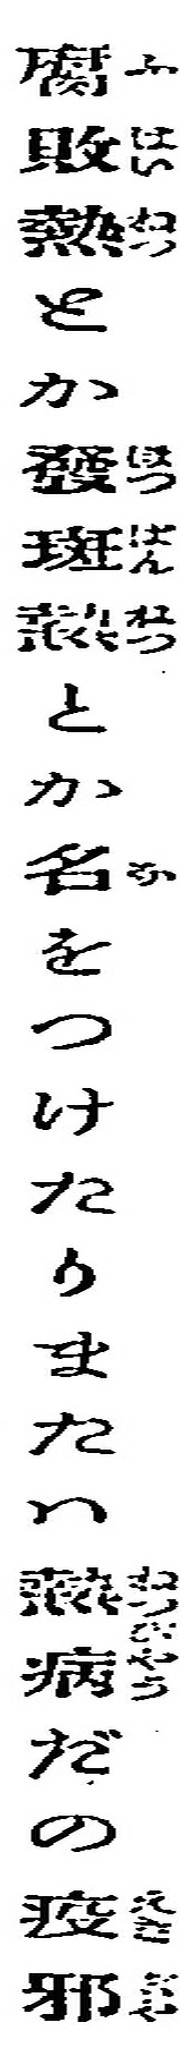腐敗熱とか發斑熱とか名をつけたりまたは熱病だの疫邪
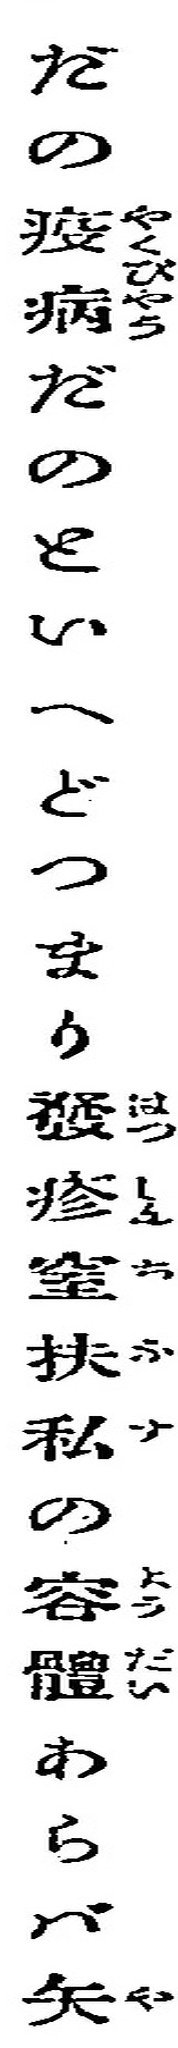だの疫病だのいへどつまり発疹窒扶私の容體あらば矢
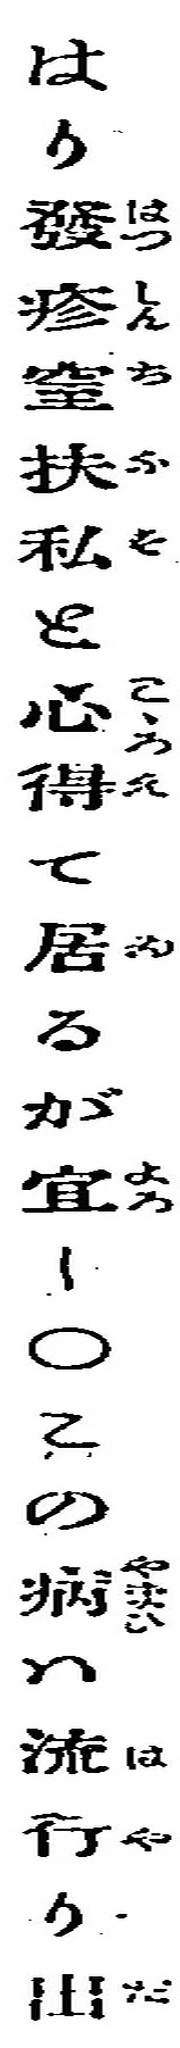はり発疹窒扶私と心得て居るが宜し〇この病は流行り出
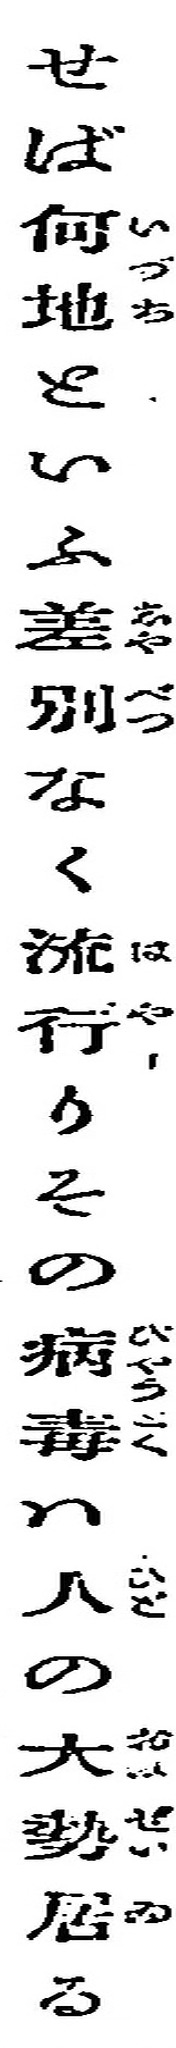せば何地といふ差別なく流行りその病毒は人の大勢居る
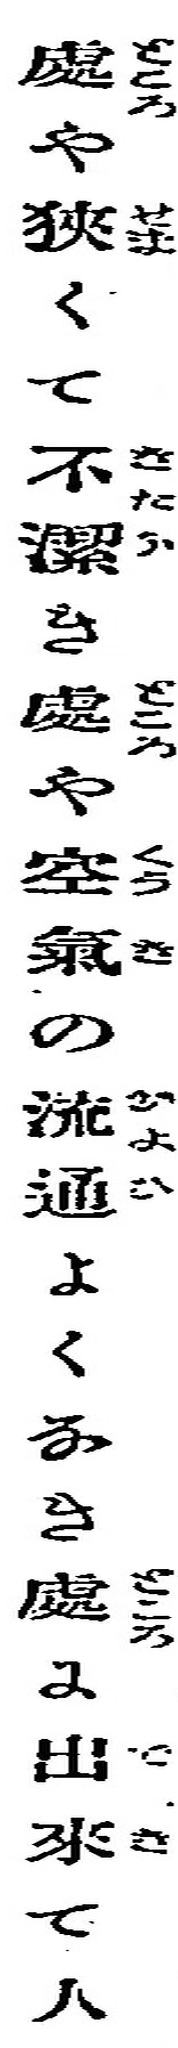處や狭くて不潔き處や空気の流通よくなき處に出來て人
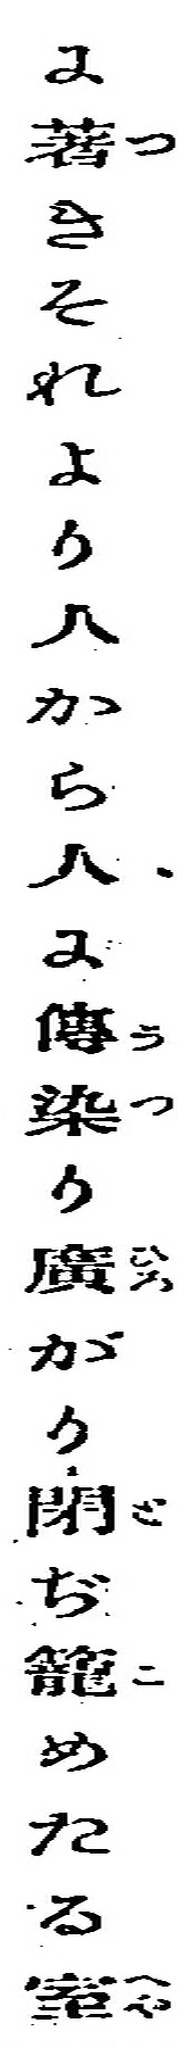に著きそれより人から人に傳染り廣がり閉ぢ籠めたる室
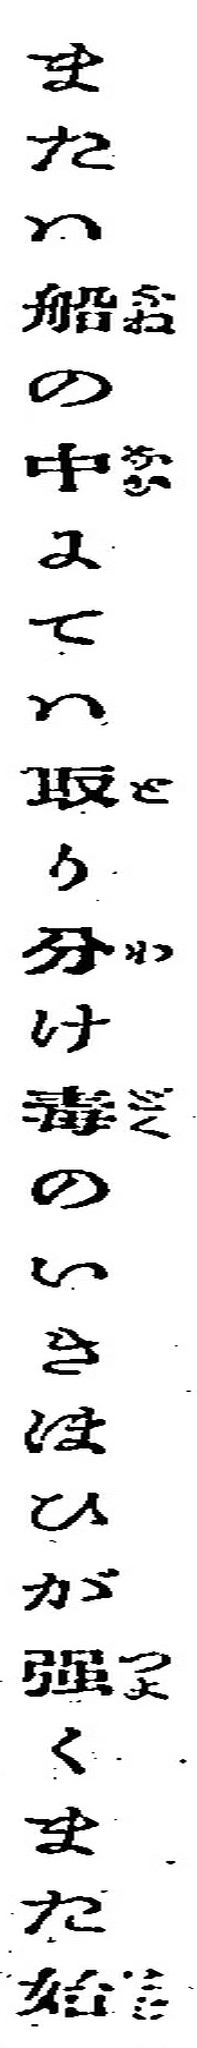または船の中にては取り分け毒のいきほひが強くまた始
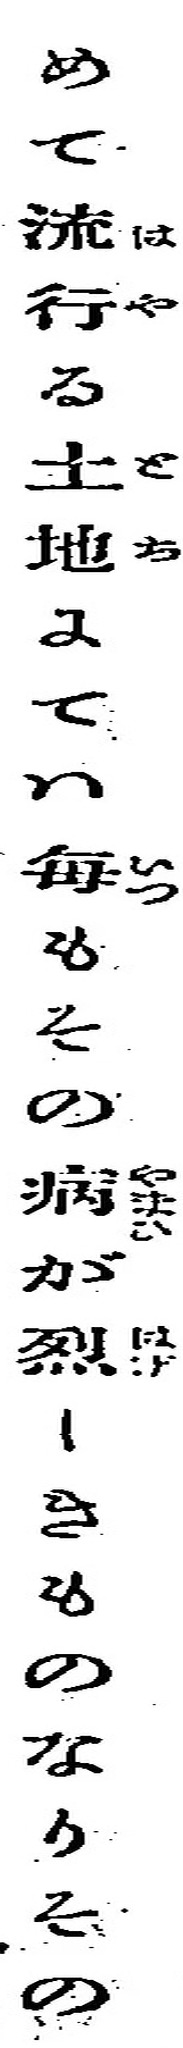めて流行る土地にては毎もその病が烈しきものなりその
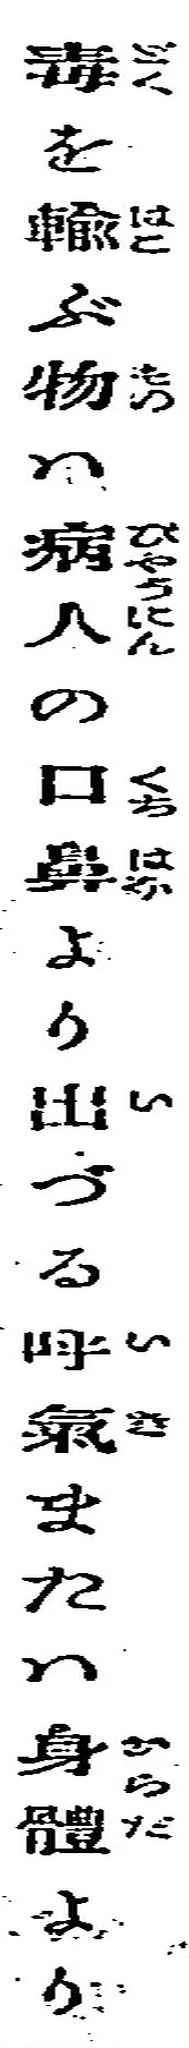毒を輸ぶ物は病人の口鼻より出づる呼気または身體より
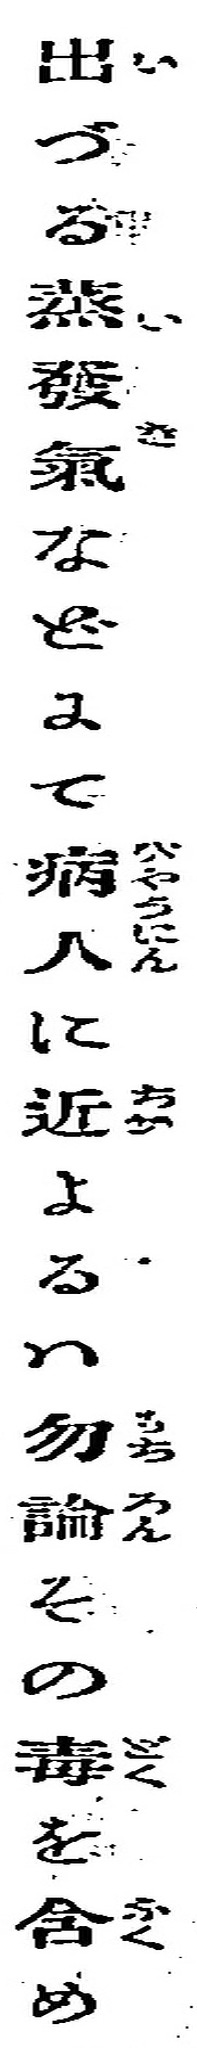出づる蒸發氣などにて病人に近よるは勿論その毒を含め
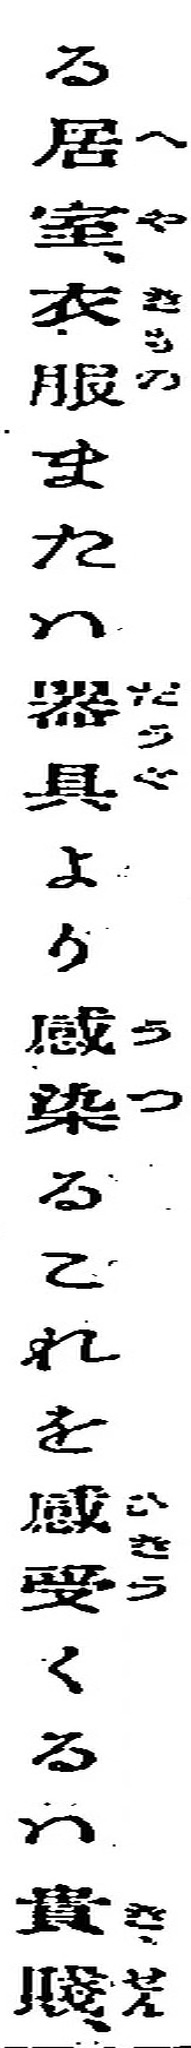る居室、衣服または器具より感染るこれを感受くるは貴賤
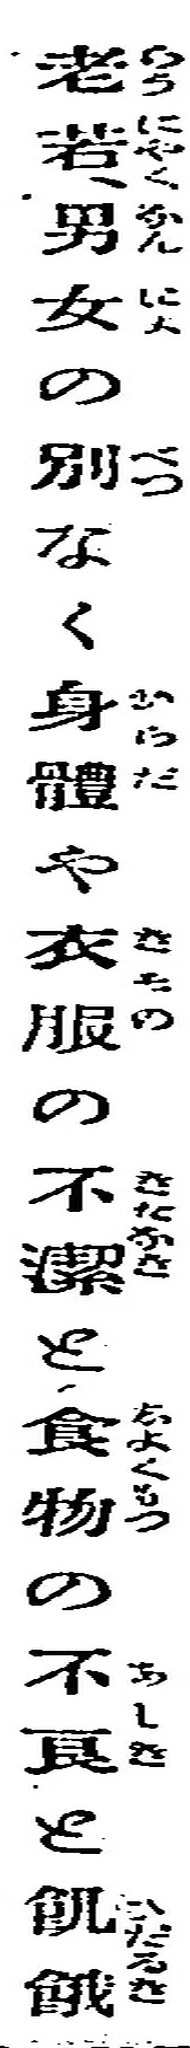老若、男女の別なく身體や衣服の不潔と食物の不良と飢餓
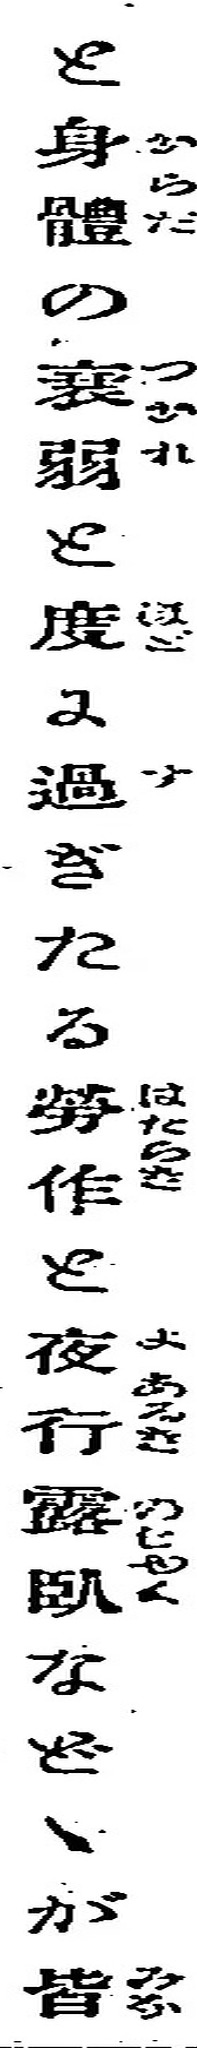と身體の衰弱と度に過ぎたる労作と夜行露臥などゝが皆
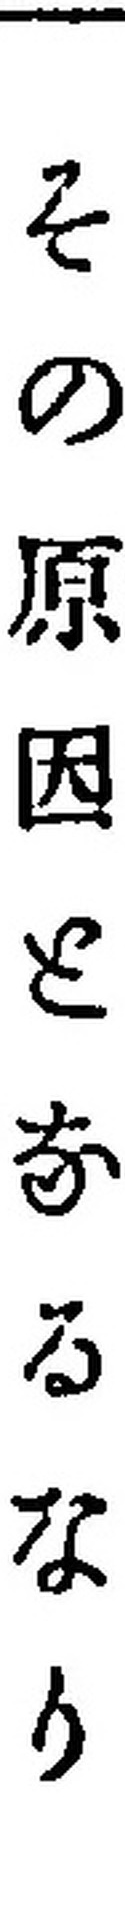その原因となるなり
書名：発疹窒扶私予防の訓
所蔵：国立国会図書館 National Diet Library, JAPAN
